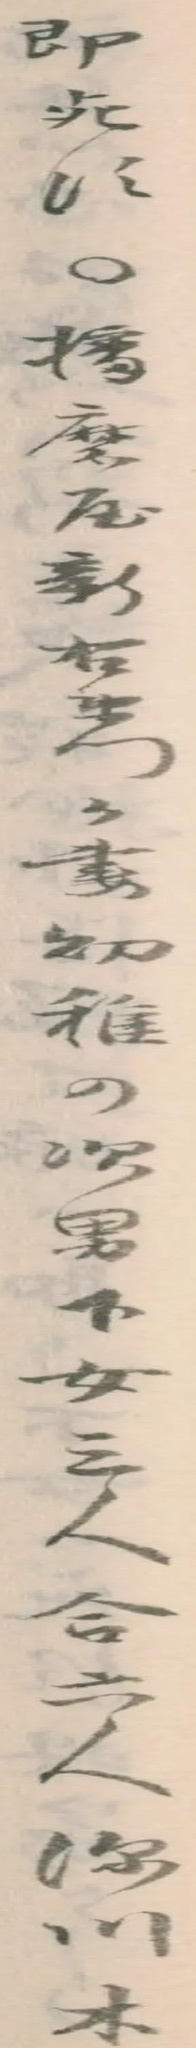即死す〇播磨屋新右衛門か妻幼稚の次男下女三人合六人深川木
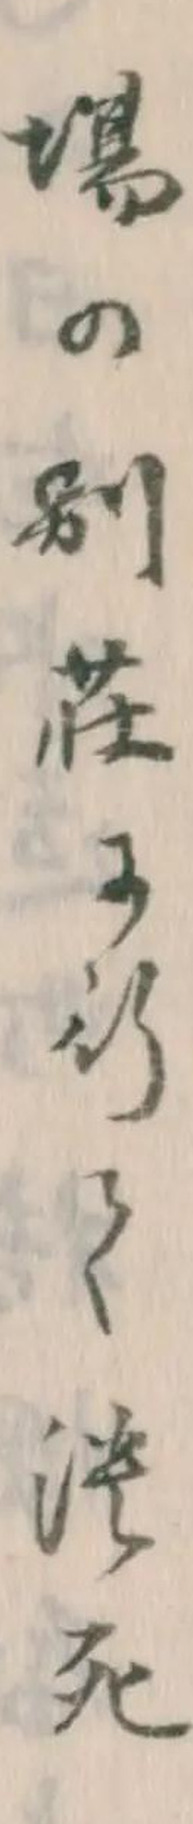場の別荘に行て潰死
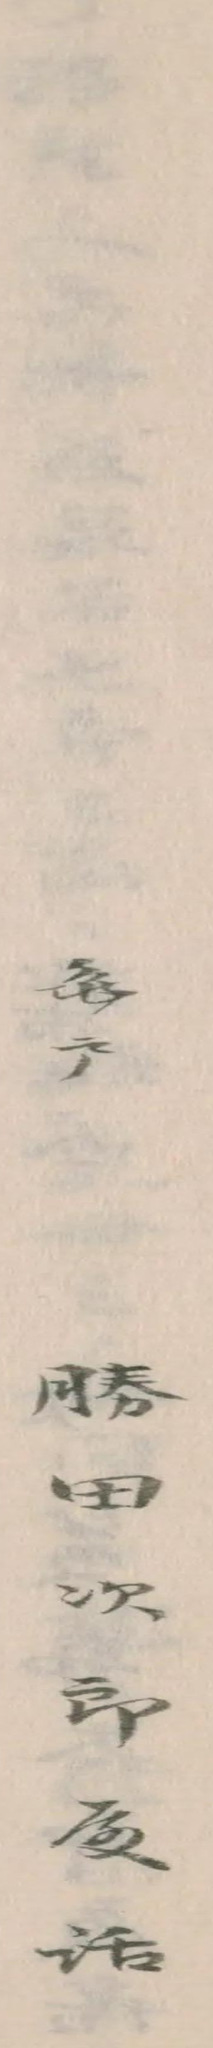亀戸勝田次郎殿話
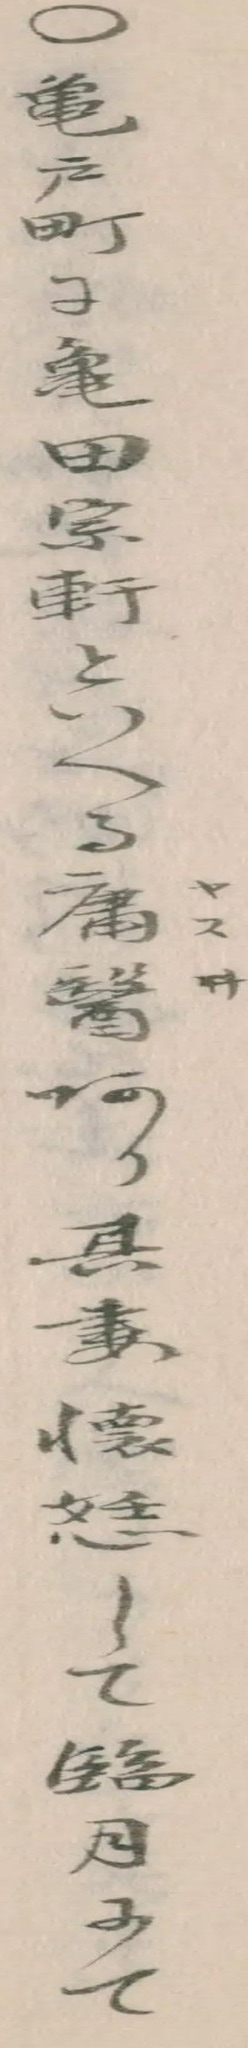〇亀戸町に亀田宗軒といへる庸医あり其妻懐妊して臨月にて
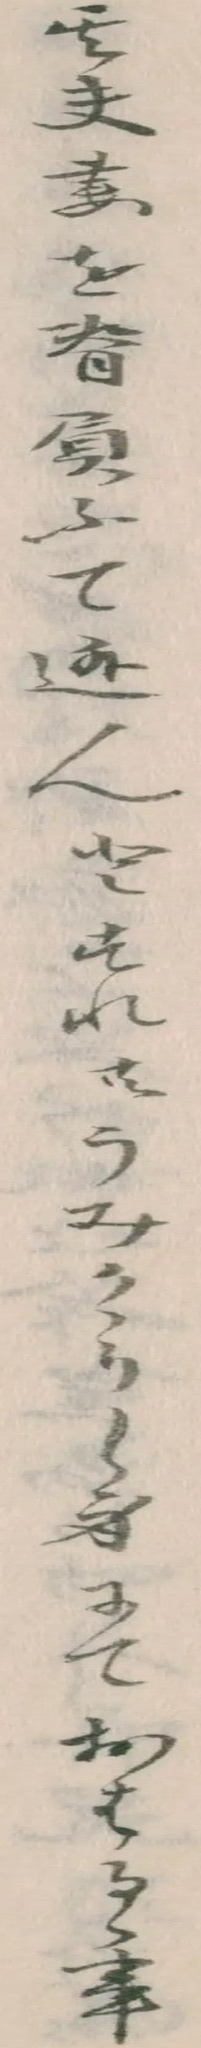其夫妻を脊負ふて逃んとすれ共うみかゝりし身にておはるゝ事
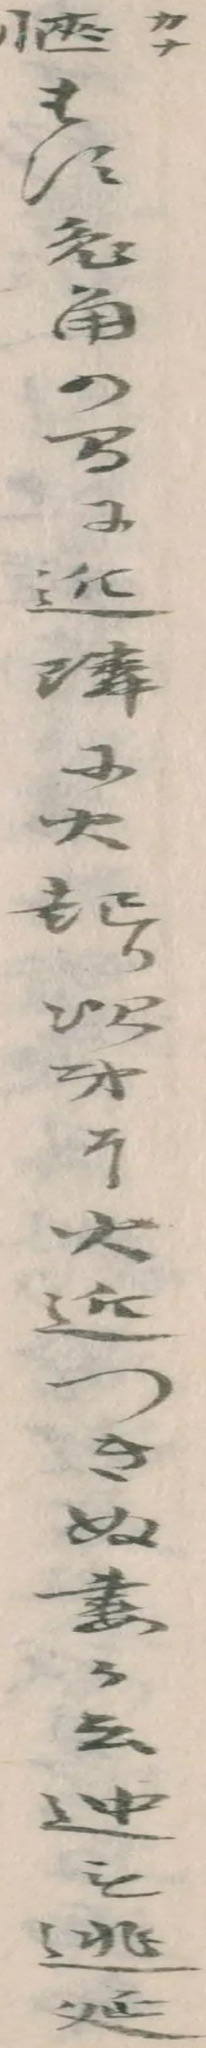陿はす兎角の間に近隣に火起り次第に火近つきぬ妻か云迚も逃延
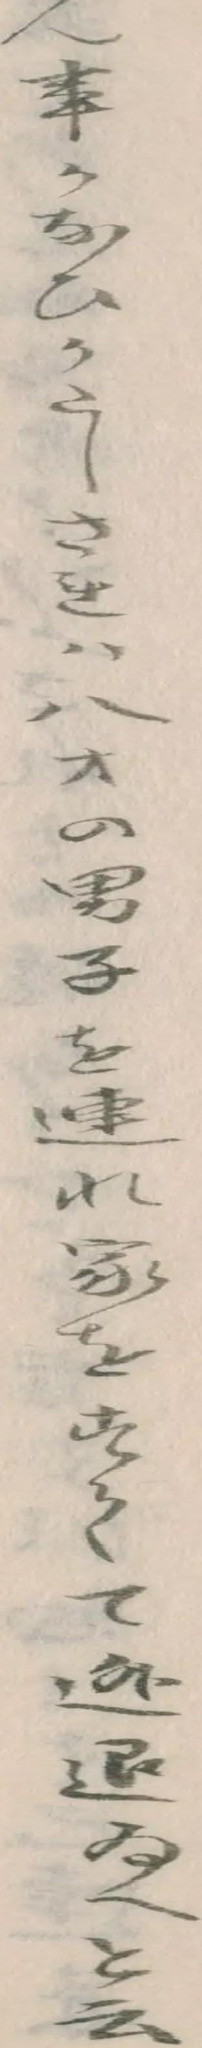ん事かなひかたしされは八才の男子を連れ家をすてて逃退ゐへと云
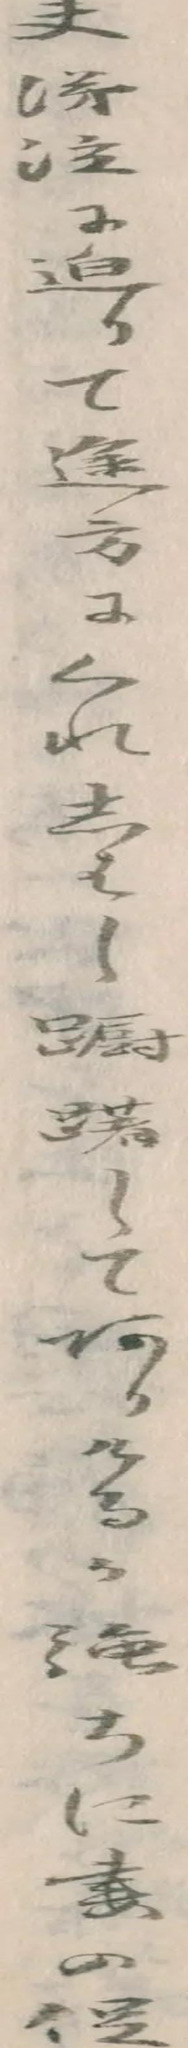夫涕泣に迫りて途方にくれししはし蹰躇してありけるか強ちに妻の促
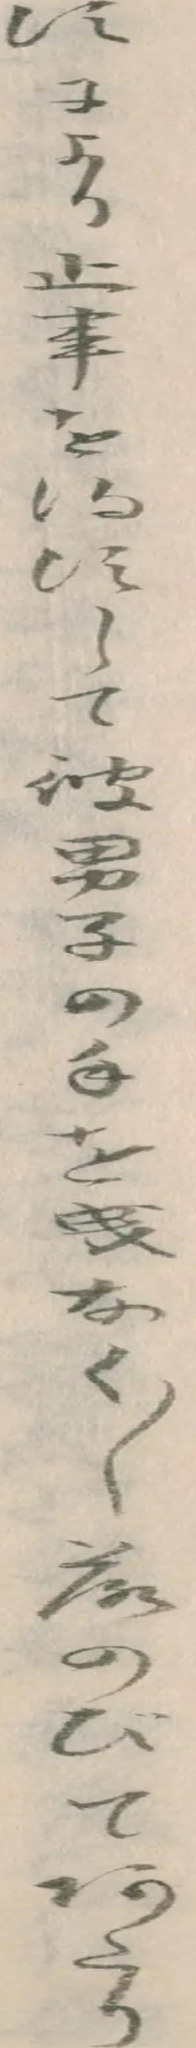すにより止事を得すして彼男子の手を曳なく〳〵落のびてあたり

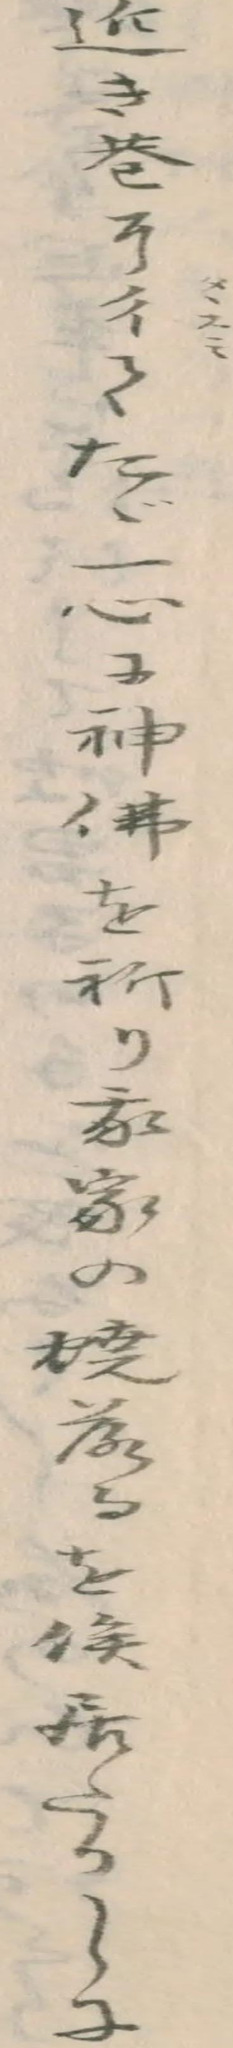近き巷に彳てたゞ一心に神仏を祈り我家の焼落るを俟居たりしに
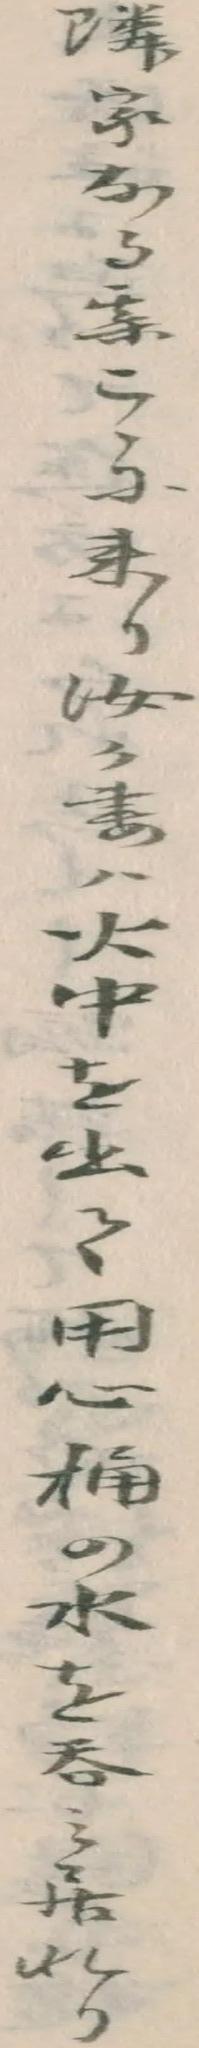隣家なる某こゝに来り汝か妻は火中を出て用心桶の水を飲み居れり
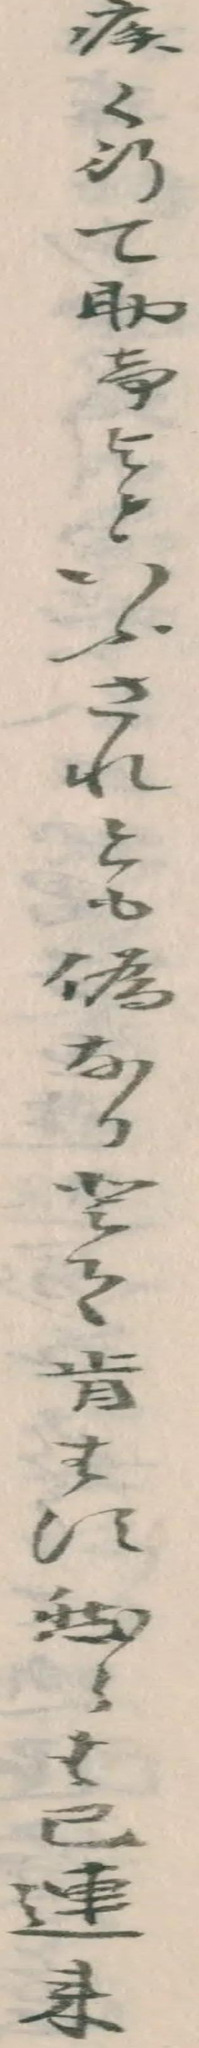疾く行て助てよといふされとも偽なりとて肯はす然らは己連来
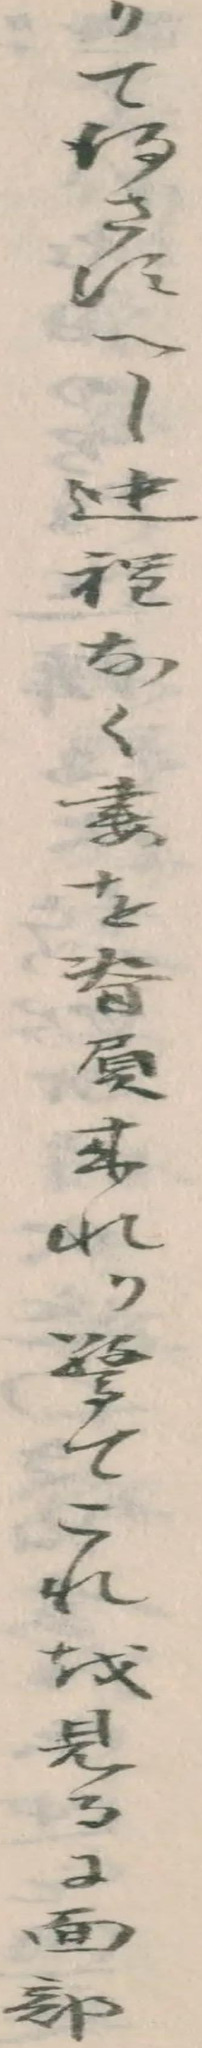りて得さすへし迚程なく妻を脊負来れり驚てこれを見るに面部
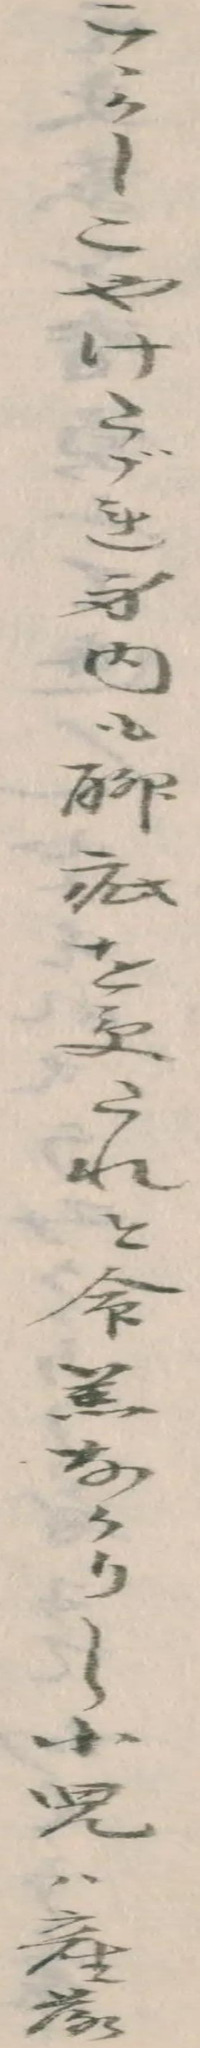こゝかしこやけたゞれ身内も聊疵を受たれと命恙なかりし小児は産落
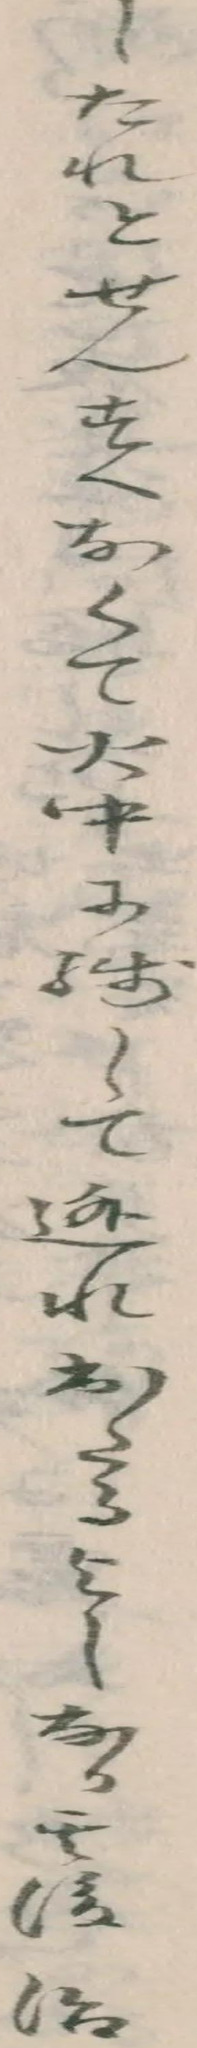したれとせんすへなくて火中に残して逃れ出たるよしなり其後治
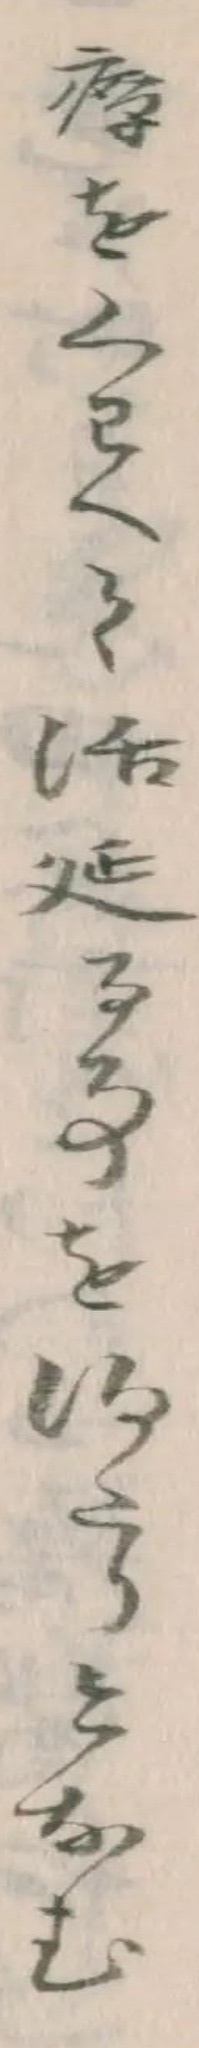療をくわへて活延る事を得たりとなむ
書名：地災撮要. 巻7-9(地震之部)
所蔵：国立国会図書館 National Diet Library, JAPAN
